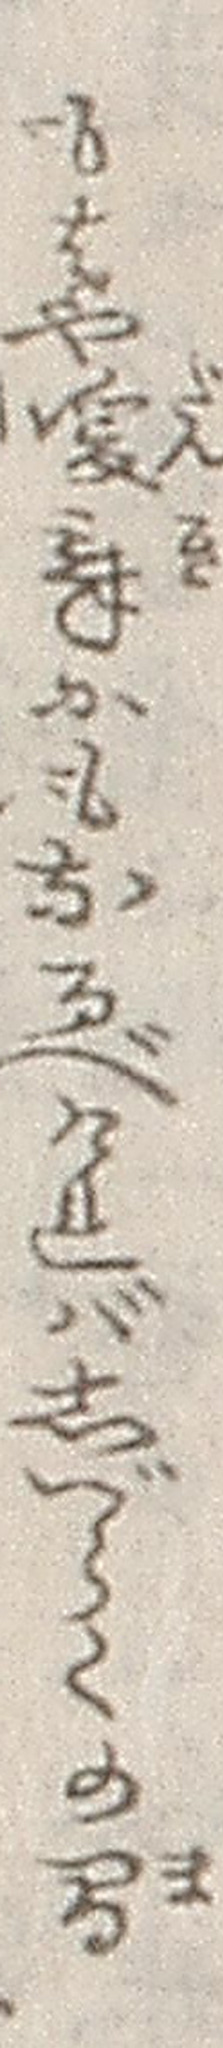もはや暖気にもなるべければしばらくの間
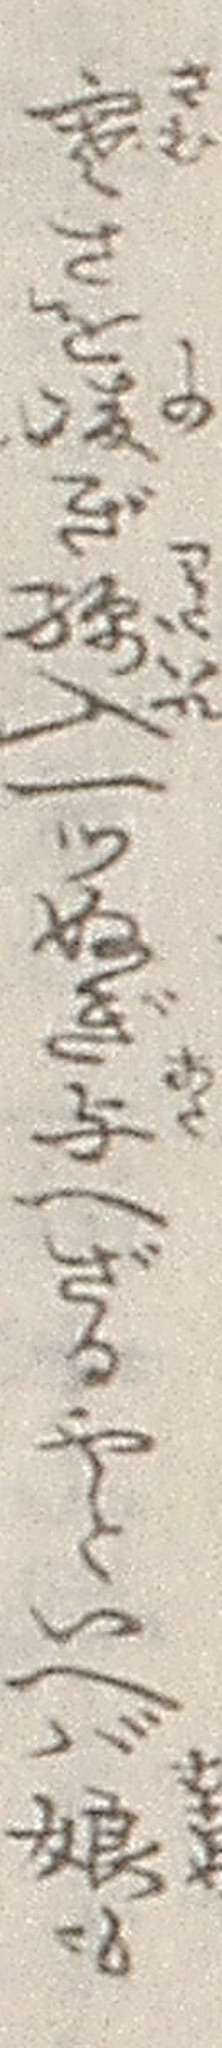寒さを凌ぎ綿入一ツぬぎ与へざるやといへば娘も
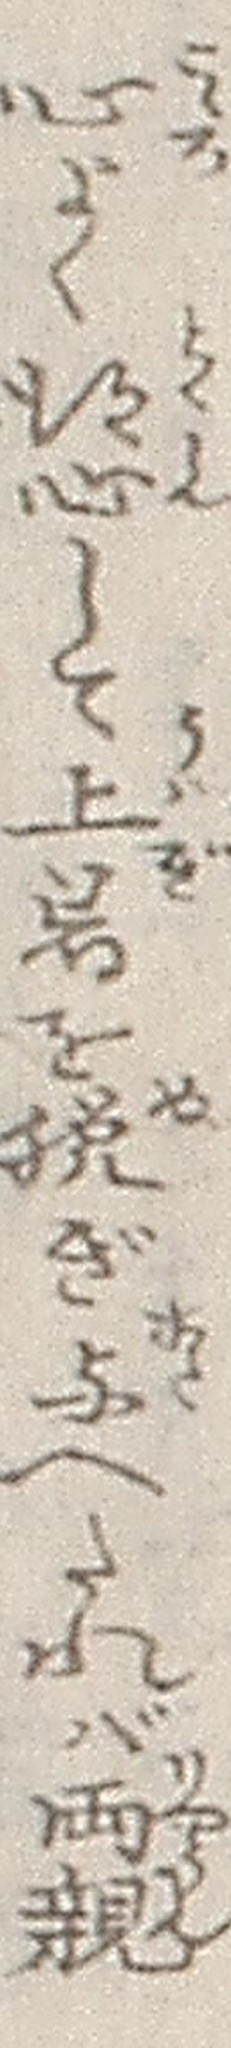心よく得心して上着を脱ぎ与へたれば両親
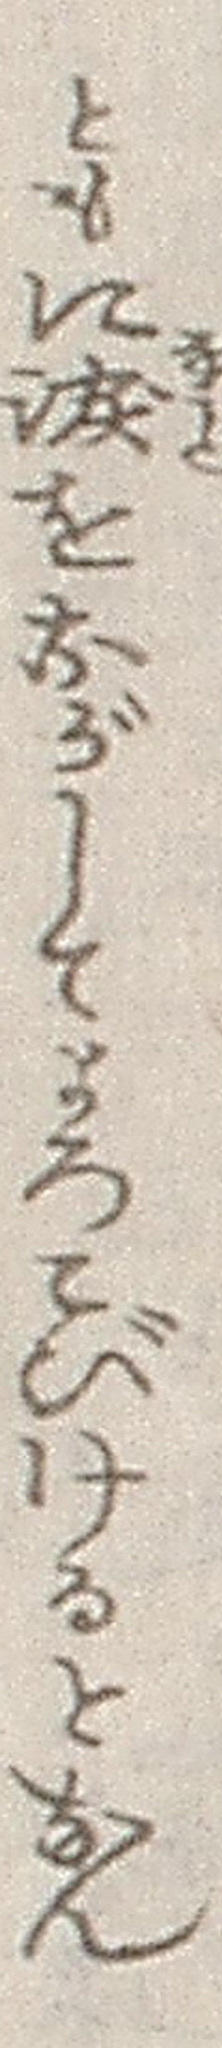ともに涙をながしてよろこびけるとなん

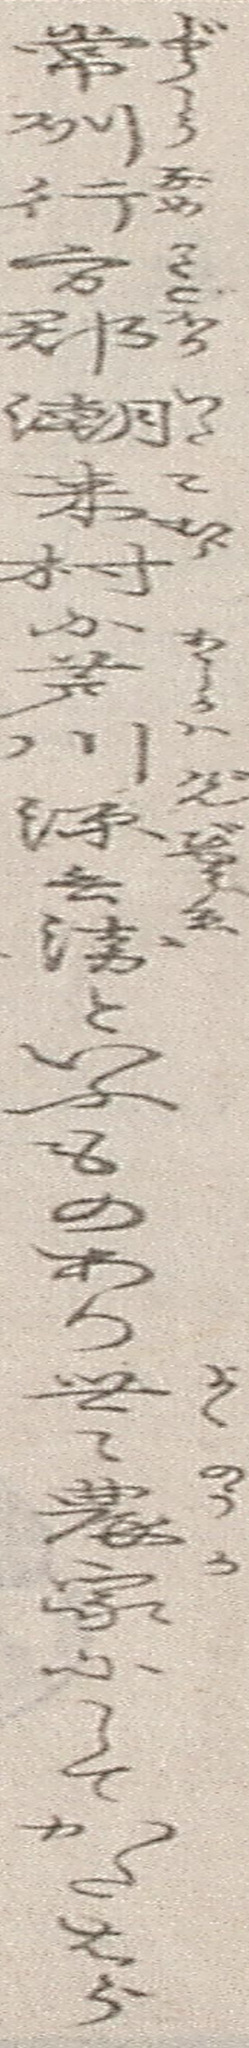常州行方郡潮来村に芦川源兵衛といふものあり世〻農家にしてかたはら
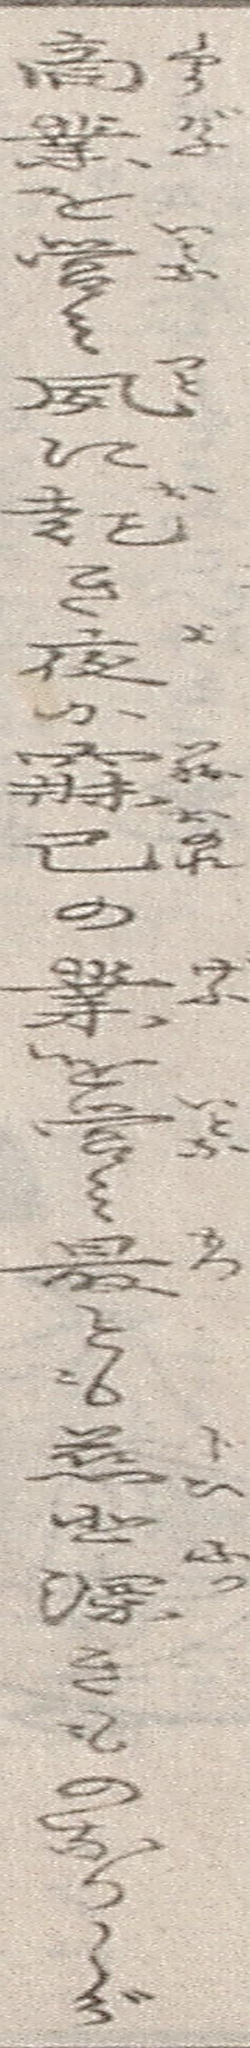商業を営み夙に起き夜に寝己の業を営み最とも慈悲深きものなりしが
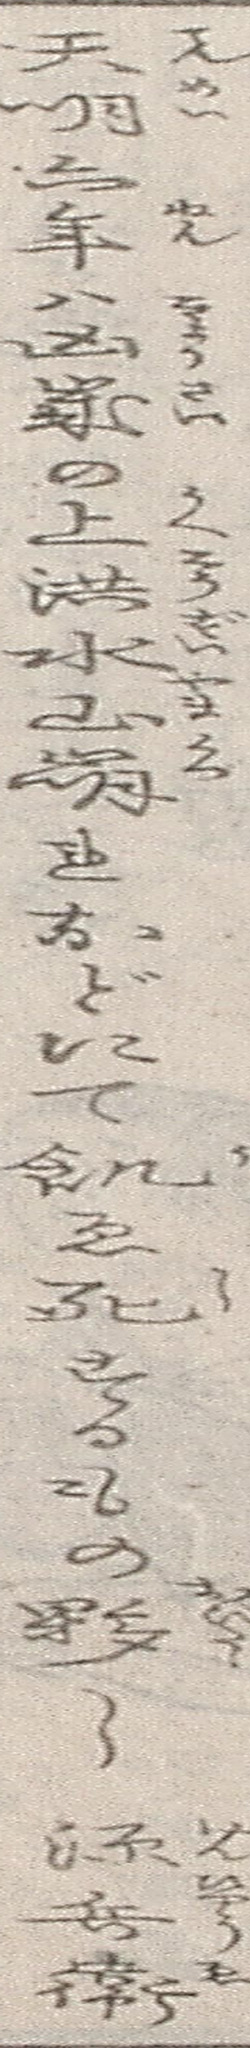天明六年は凶歳の上洪水山崩れなどにて飢ゑ死するもの夥し源兵衛
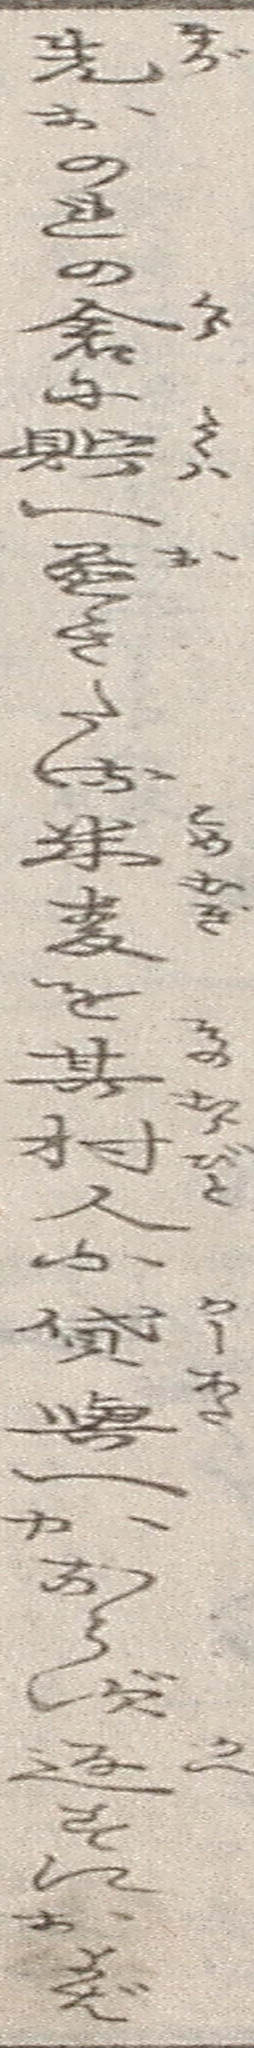先おのれの倉に貯へ置きたる米麦を其村人に貸與へかならず返すにおよば
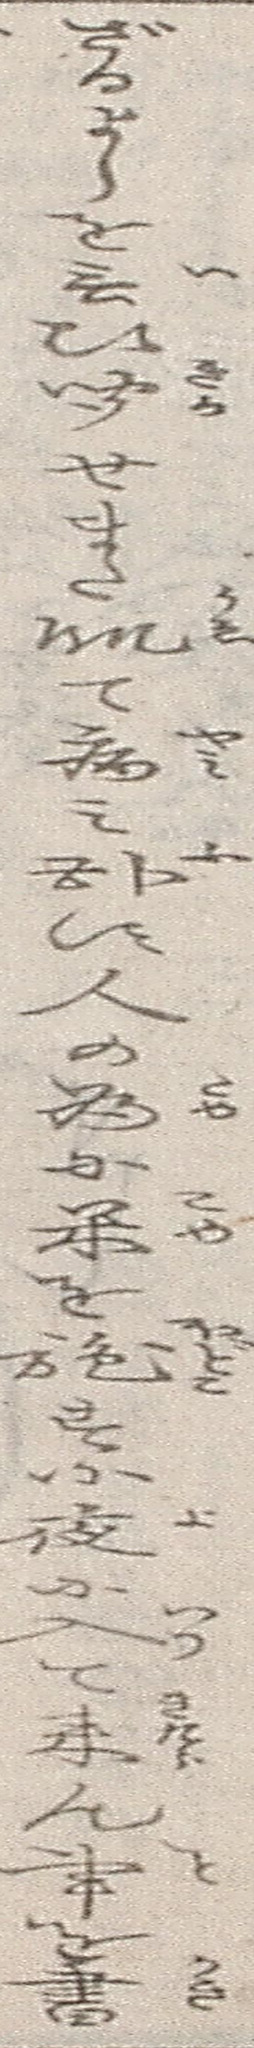ざるよしを言ひ聞せまた飢て病み臥す人の為に米を施すに夜に入て来ん事を書
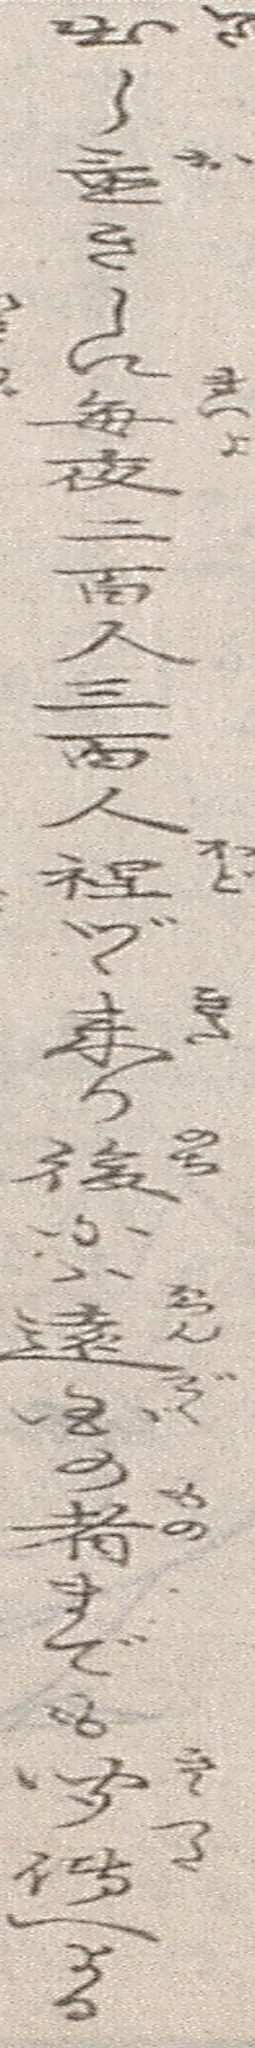出し置きしに毎夜二百人三百人程ヅヽ来り後には遠国の者までも聞伝へよる
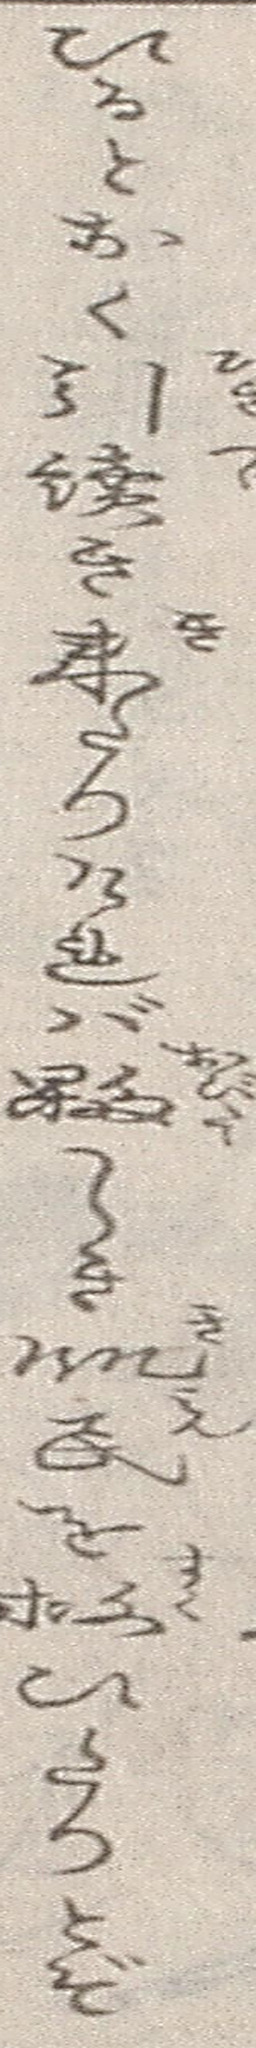ひるとなく引続き来たりければ夥しき飢民を救ひたりとぞ
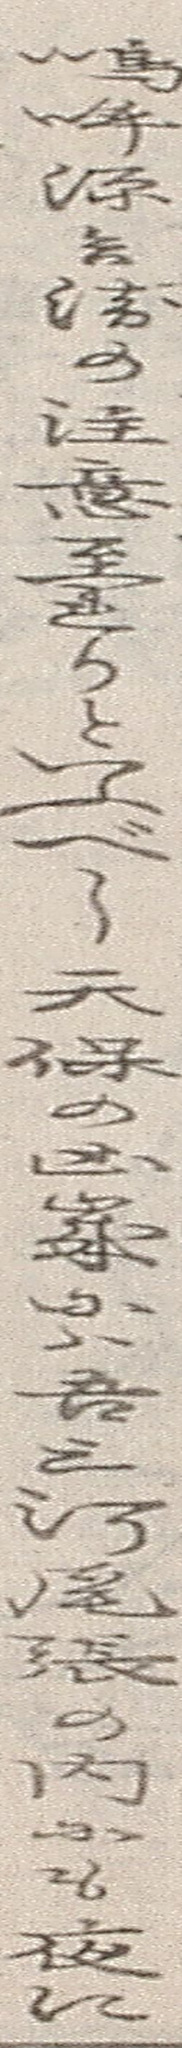嗚呼源兵衛の注意至れりといふべし天保の凶歳には吾三河尾張の内にも夜に
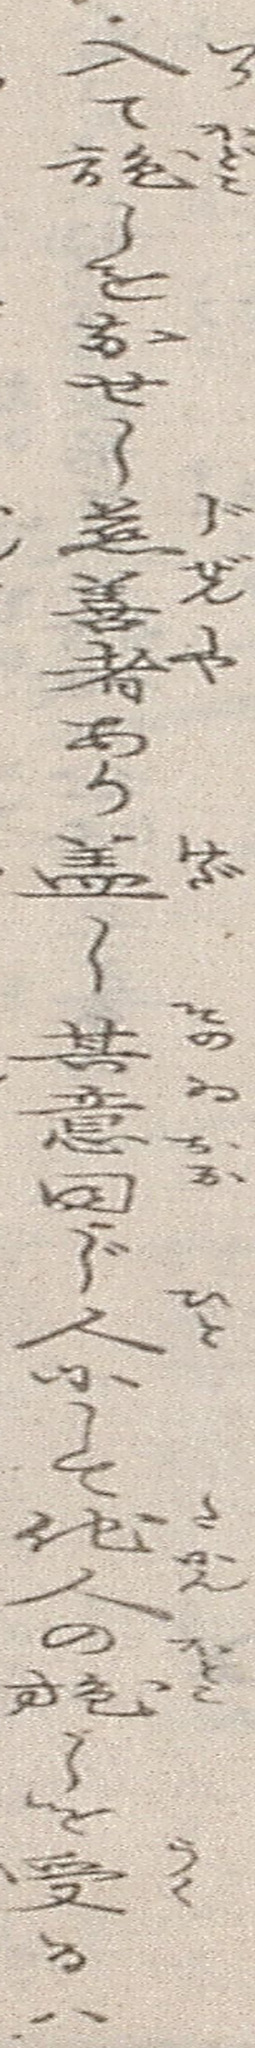入て施しをなせし慈善者あり蓋し其意同じ人にして他人の施しを受るは
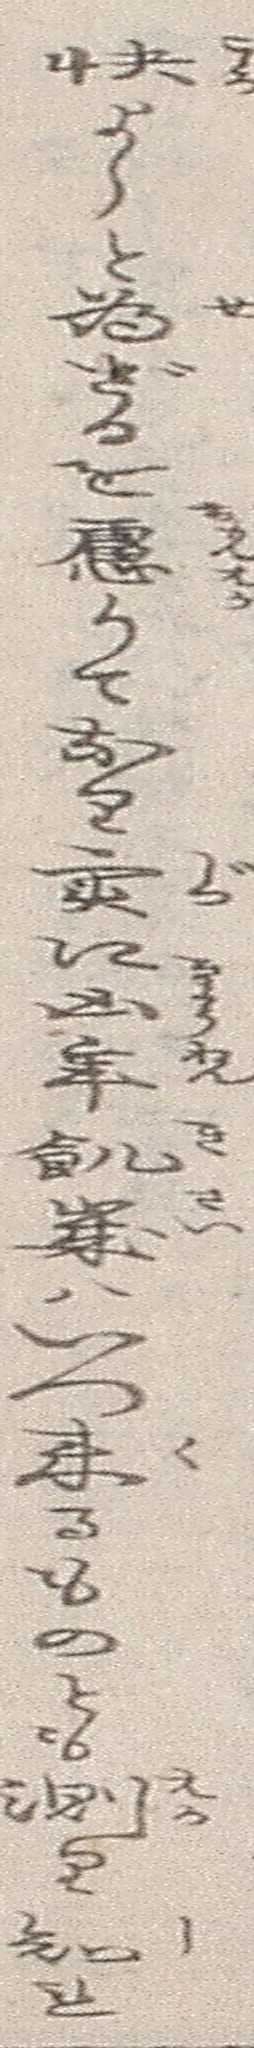快よしと為ざるを慮りてなり実に凶年飢歳はいつ来るものとも測り知れ
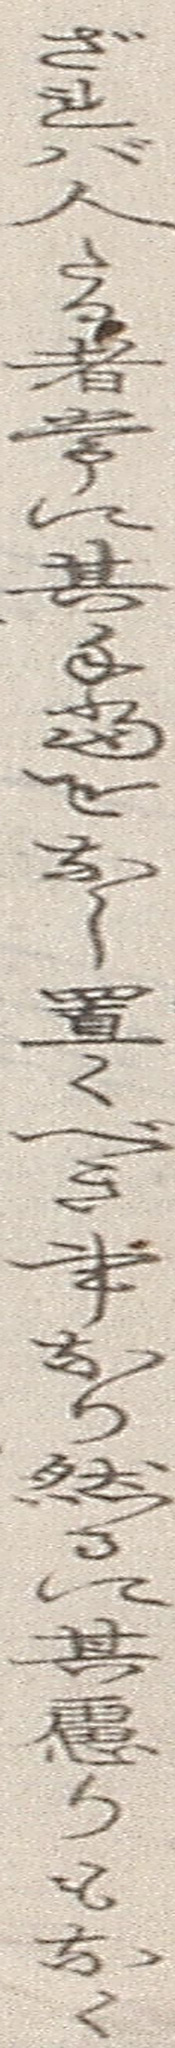ざれば人たる者常に其手当をなし置くべき事なり然るに其慮りもなく
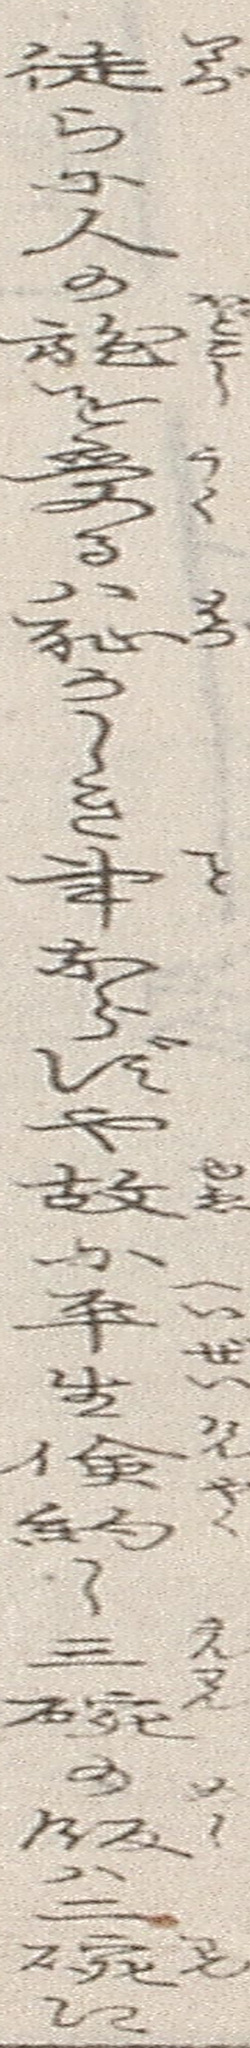徒らに人の施を受るは恥かしき事ならずや故に平生倹約し三碗の飯は二碗に
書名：凶荒図録　完
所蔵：東京大学地震研究所図書室 Earthquake Research Institute Library, The University of Tokyo, JAPAN
